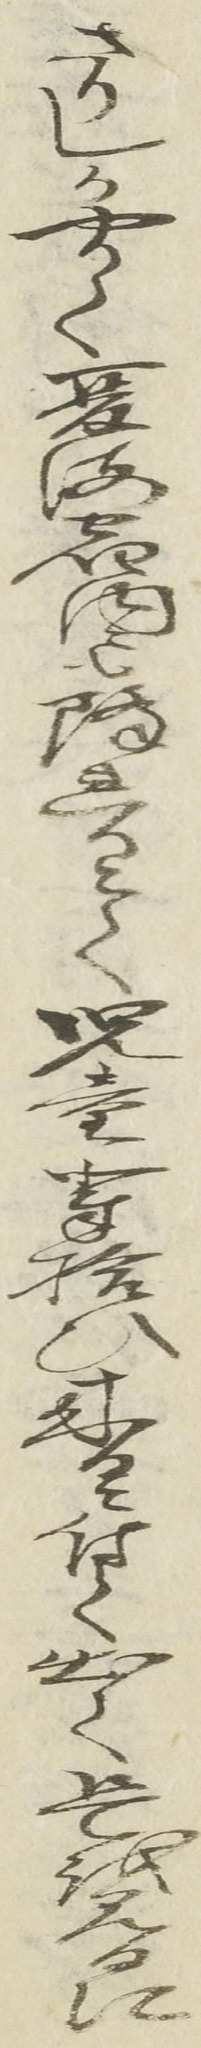さりしかやかて夏海宿内ニも降れりとて児童輩拾ひ来るを付て出て是を見るに
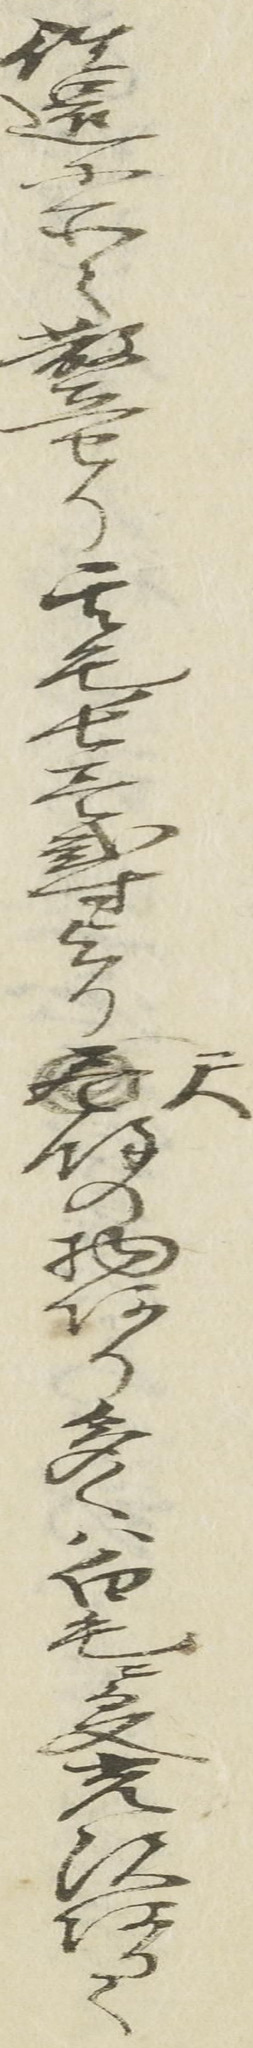往還に所〻散在セり其毛ノ長壱弐寸より尺余の物あり多くハ白毛ニ而又光沢ありて
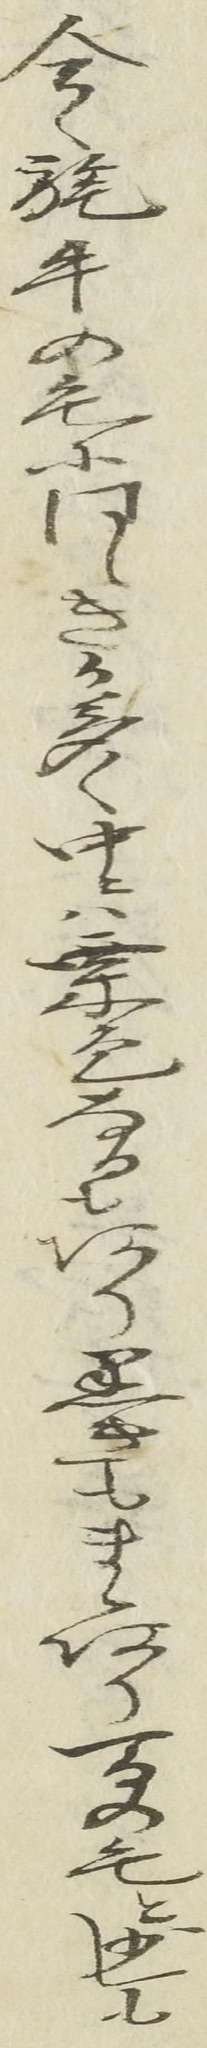全く旄牛の毛に同しきか多く中ニハ栗色なるもあり黒きもまゝあり馬の毛と少しも
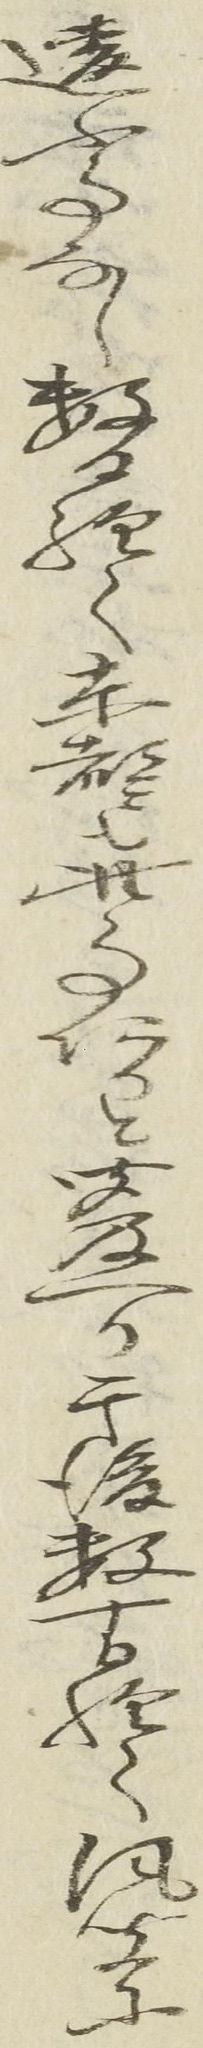違ふ事なし数日経て東都ニも此事ありと聞及へり其後数十日経て風聞に
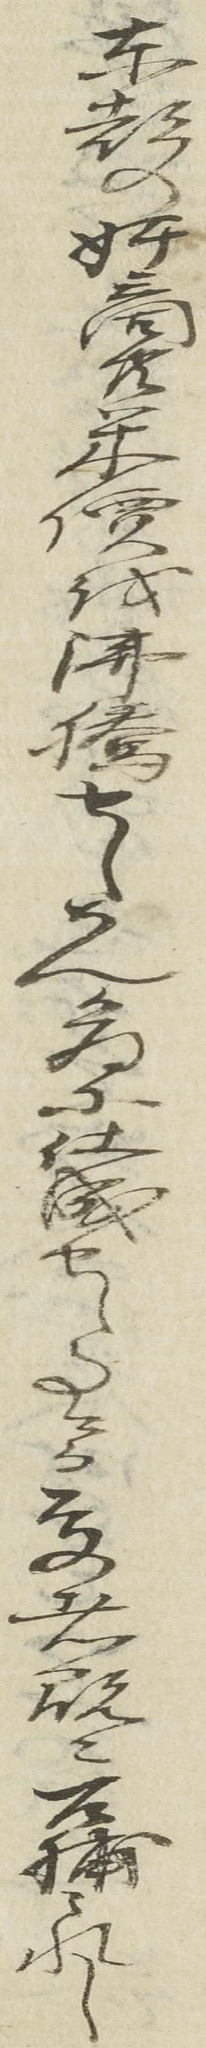東都の奸商共米價を沸騰セしめんか為に仕成セし事ニ而その者既ニ召捕られし
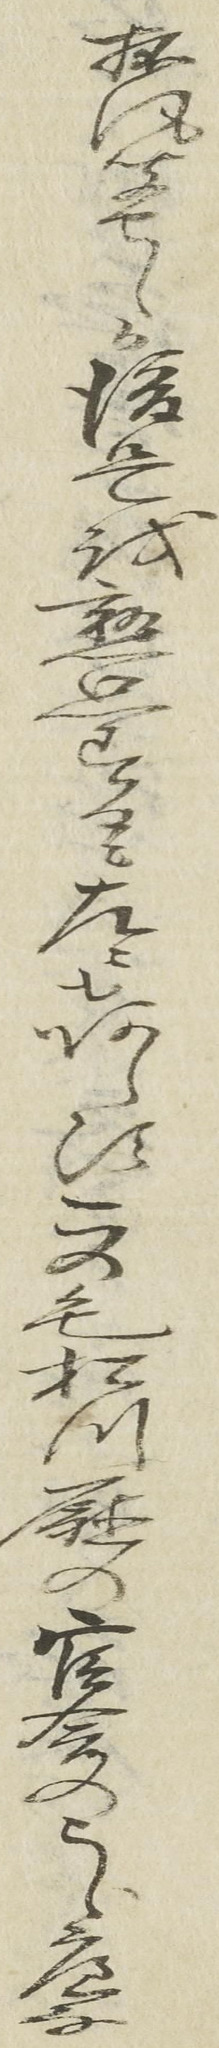抔風聞セしか後是を熟思するニ左ニもあらすこの毛松川殿？の官舎のうら庭な
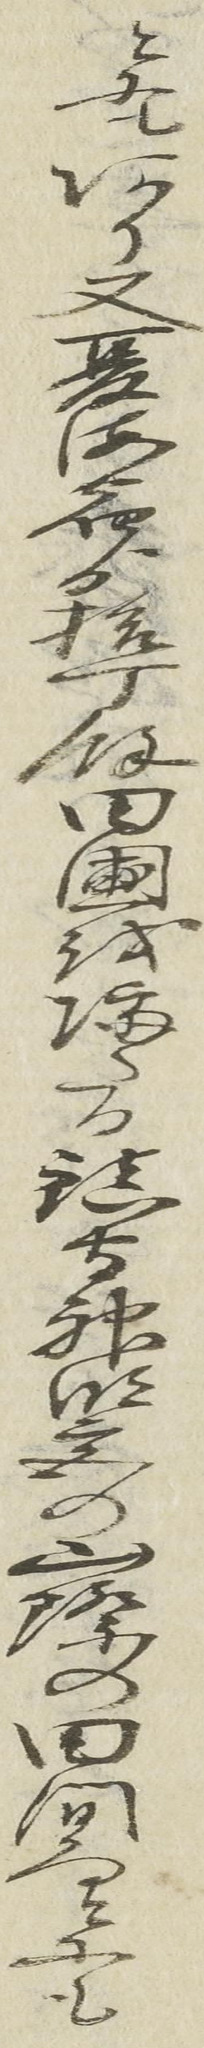とにもあり又夏海宿ゟ拾丁余田圃を隔たる鎮守神明宮の山際の田間なとにも
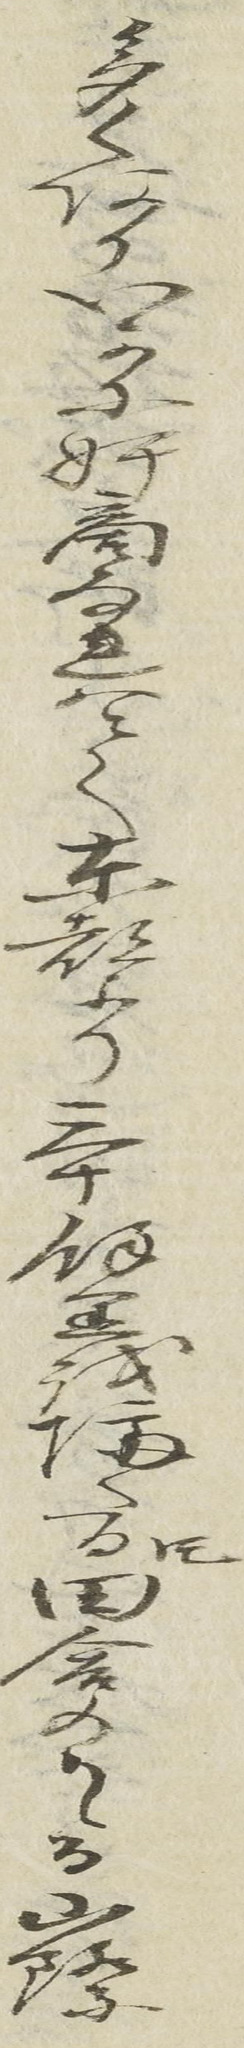多くありいかに奸商なれハとて東都より三十余里を隔たる片田舎のかゝる山際
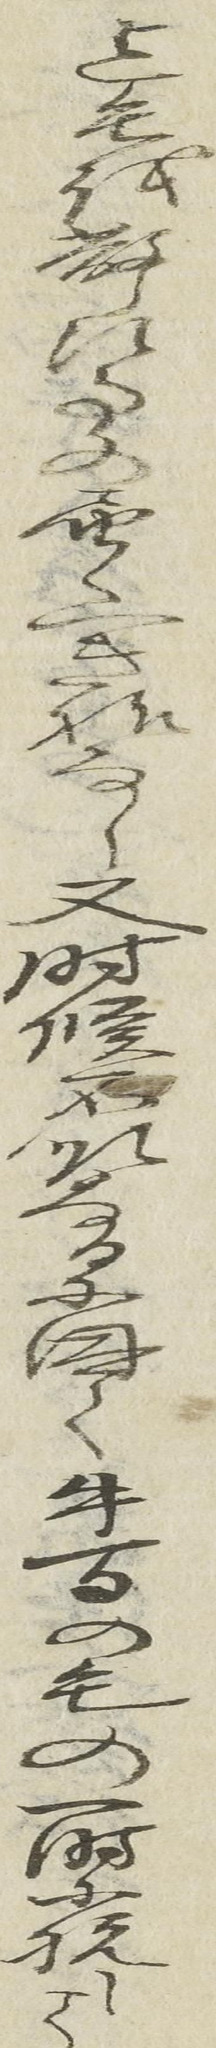迄毛を散す事の届くへき様なし又時候不順なるに因て牛馬の毛の一時に脱して
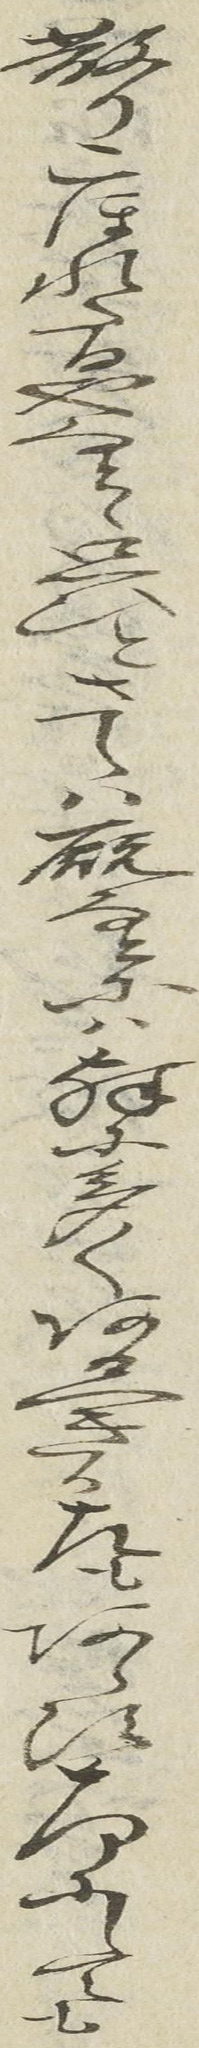散りこほれたるやなとゝ思ひとさらハ厩なとにハ殊に多くあるへきか左もあらす如何にても
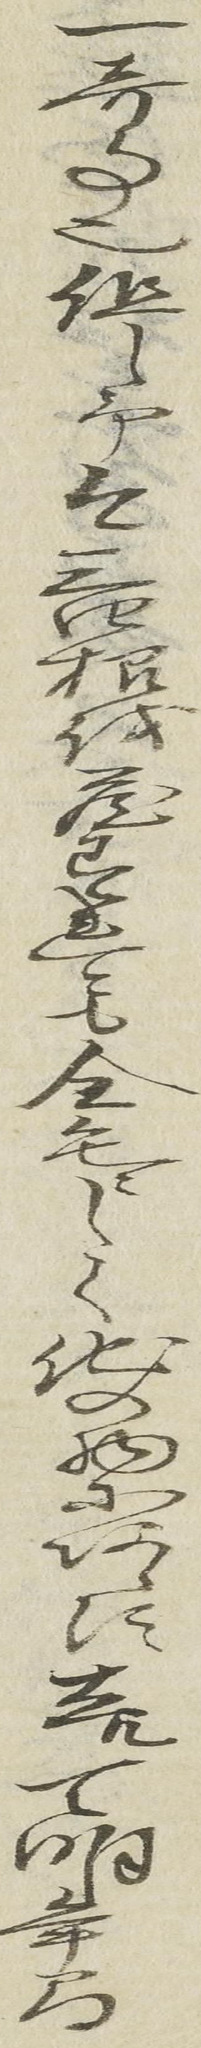一奇事也但し予今三四根？を蔵すれとも全毛ニして他の物にあらす去ル天明年間
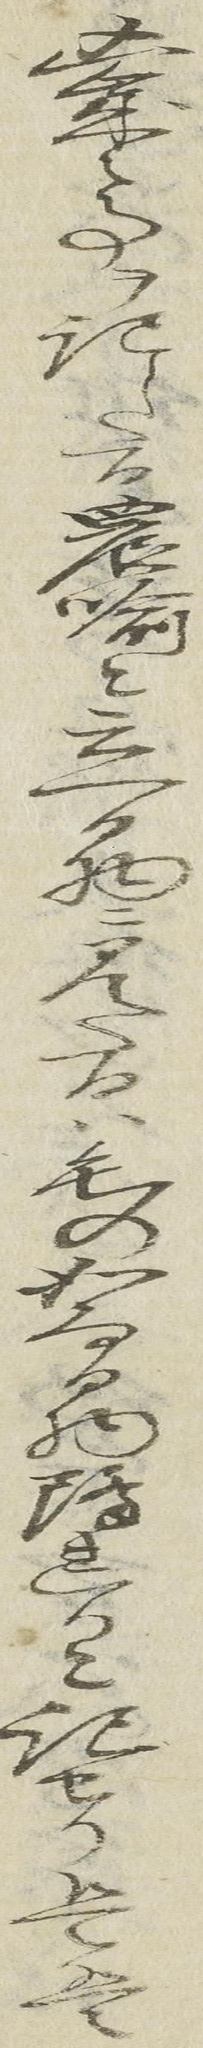凶歳之事ヲ記したる農喩と云へる物ニ見たるハ毛の如なる物降れりと記セり是は
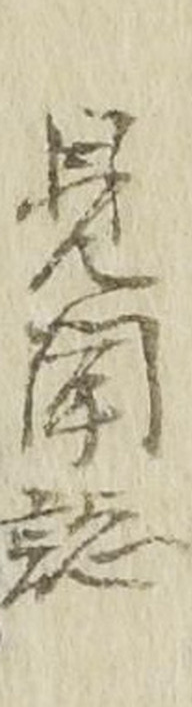見聞誌
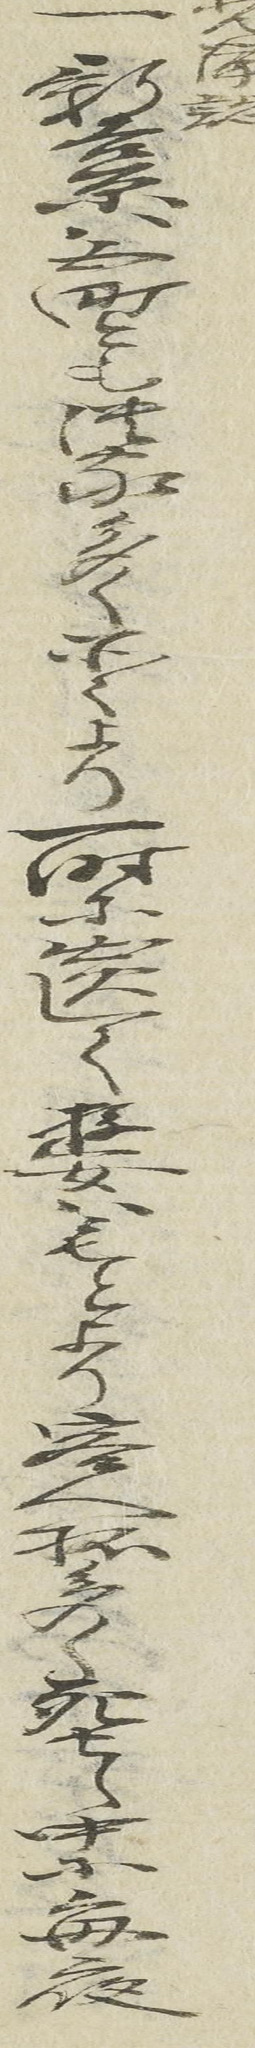一新吉原ハ五町とも潰家多く所〻より一時に出火して遊女ハもとより客人抔多く死亡し中に毎夜
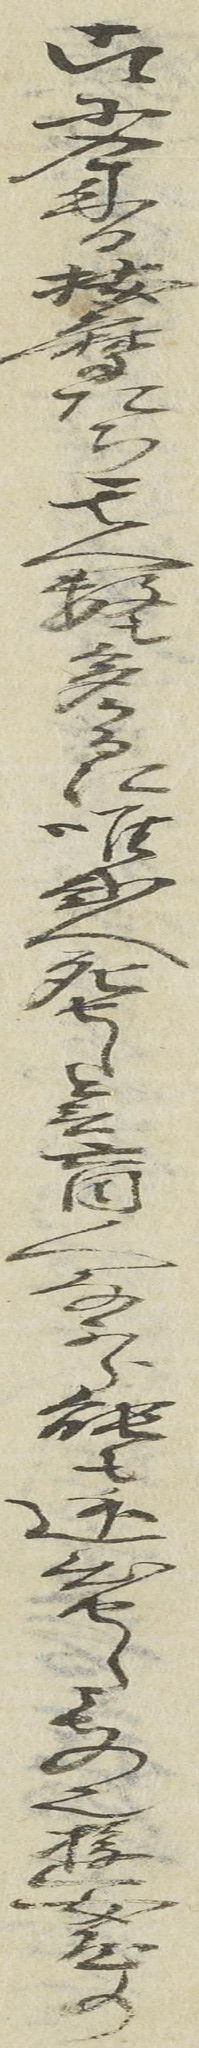こゝに入来る按摩たち其人数も多かるに唯弐人死セしと云盲人なから能も逃出セしもの也遊女屋の
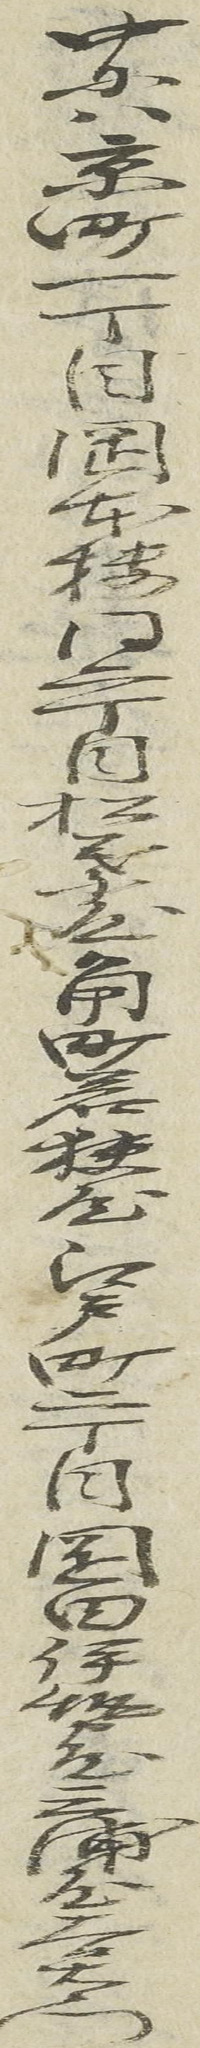中にハ京町一丁目岡本楼同二丁目松葉屋角町若狭屋江戸町二丁目岡田伊勢屋三浦屋吉右衛門
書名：安政乙卯江戸大地震筆記　安政丙辰八月大阪大雷雨之記追加　安政三辰年七月松前辺大地震并八月大風雨記録
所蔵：東京大学地震研究所図書室 Earthquake Research Institute Library, The University of Tokyo, JAPAN
